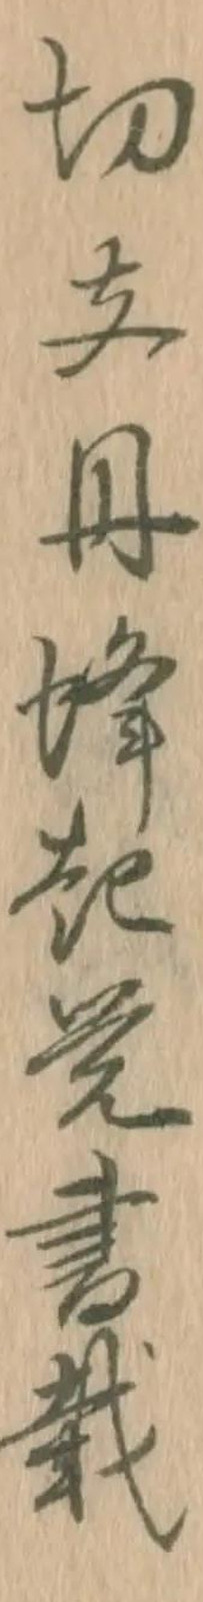切支丹蜂起覚書載
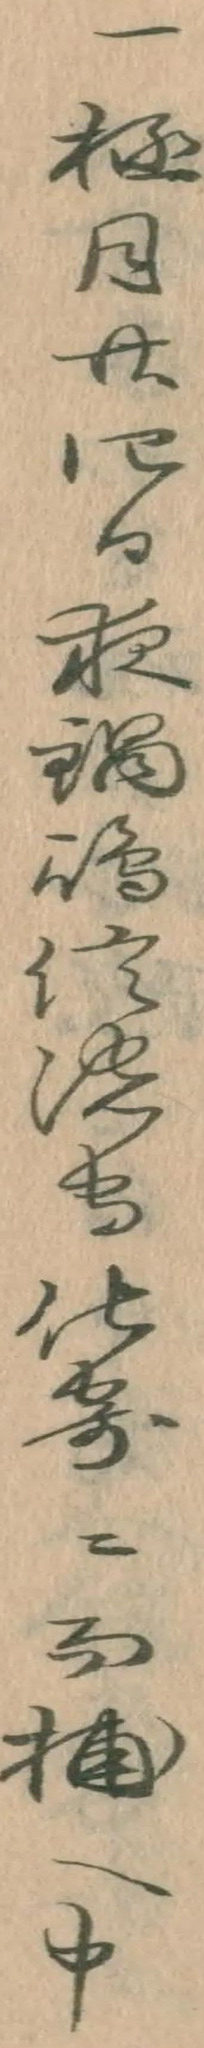一極月廿四日夜鍋島信濃守仕寄に而捕へ申
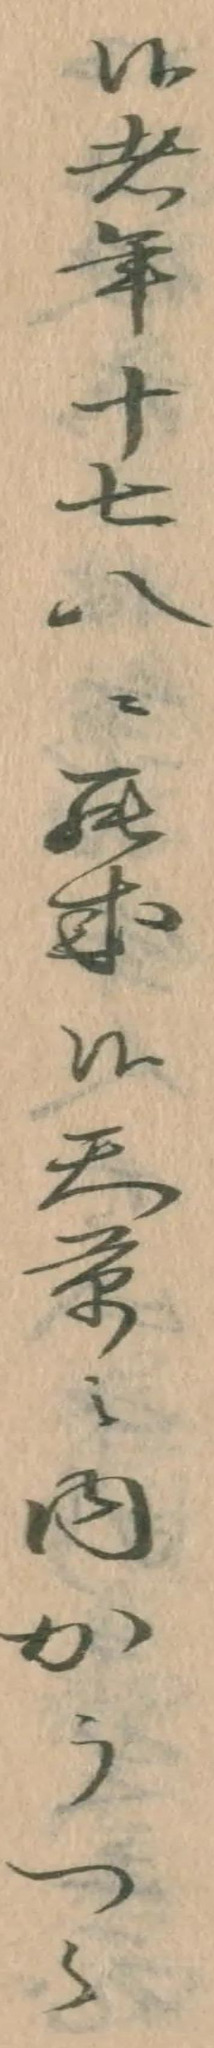候者年十七八に罷成候天草之内かうつら
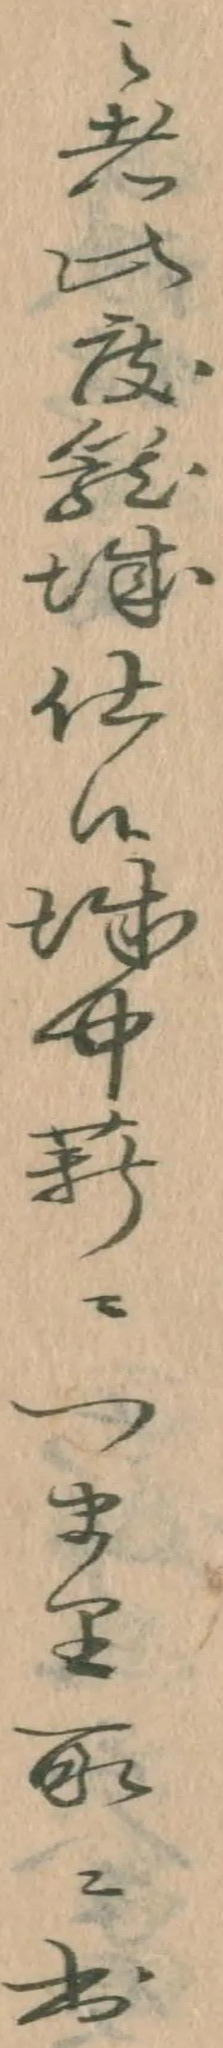之者此度籠城仕候城中薪につま里取に出
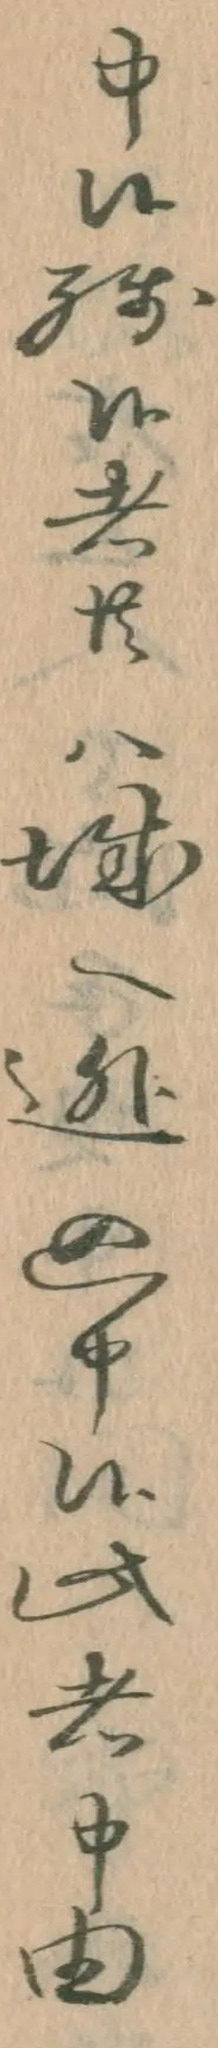申候残候者共は城へ逃込申候此者申由
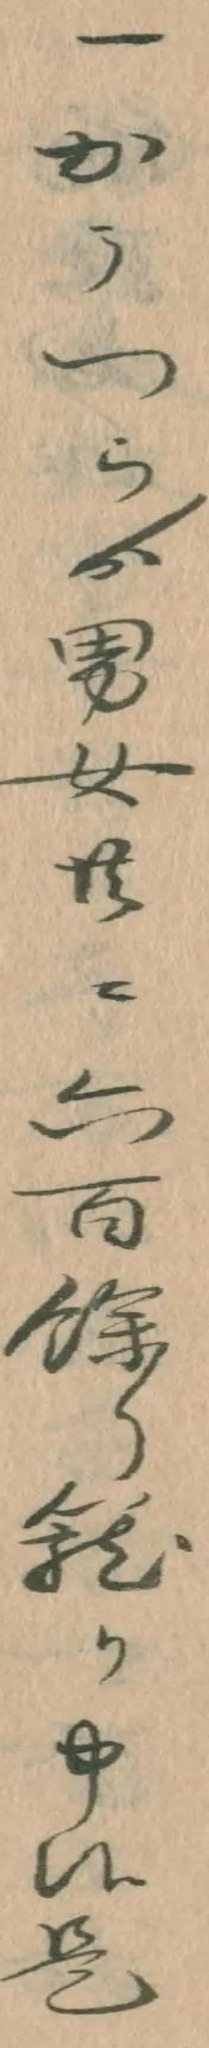一かうつらゟ男女共に六百余り籠り申候是
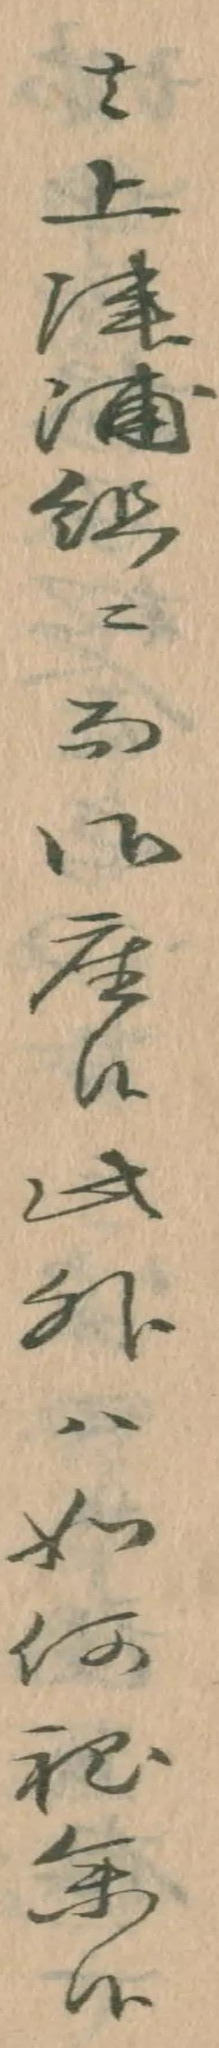者上津浦組に而御座候此外は如何程参候
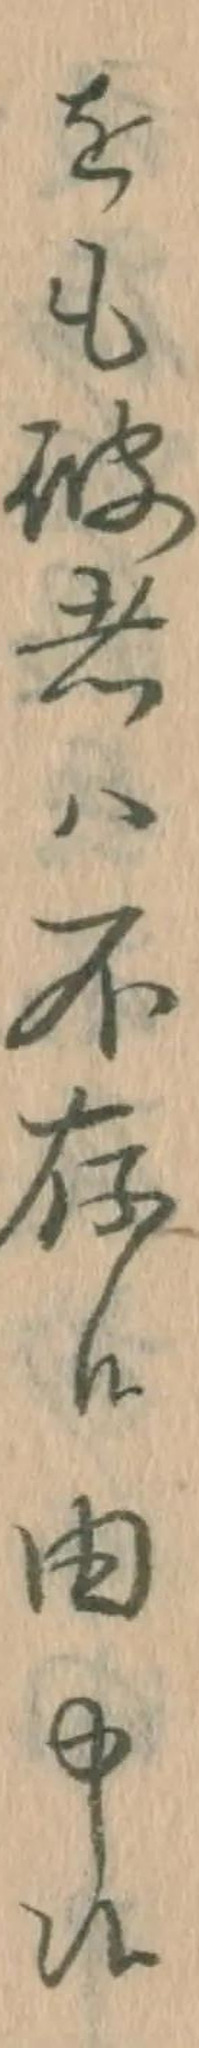をも彼者は不存候由申候
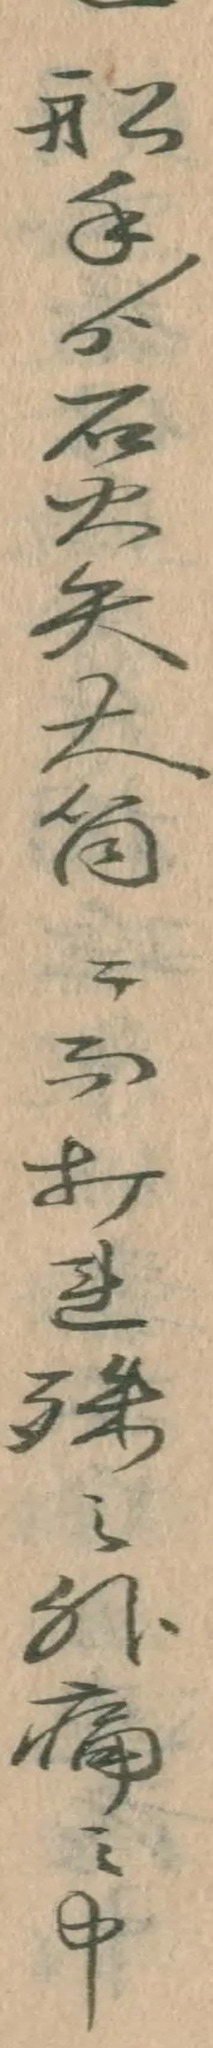一舩手ゟ石火矢大筒に而打連殊之外痛み申
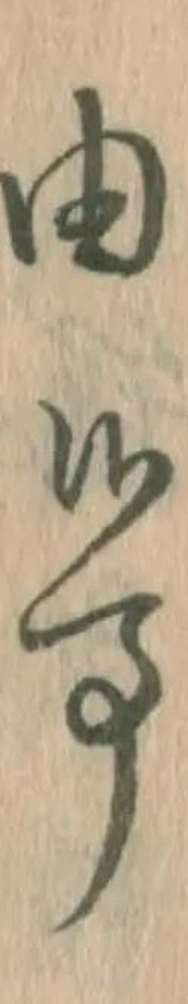由候事
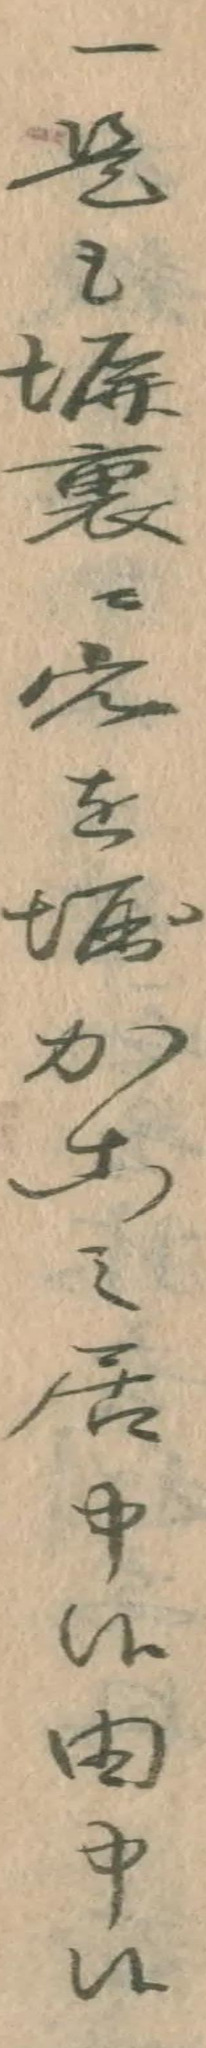一是も塀裏に穴を堀か古み居申候由申候
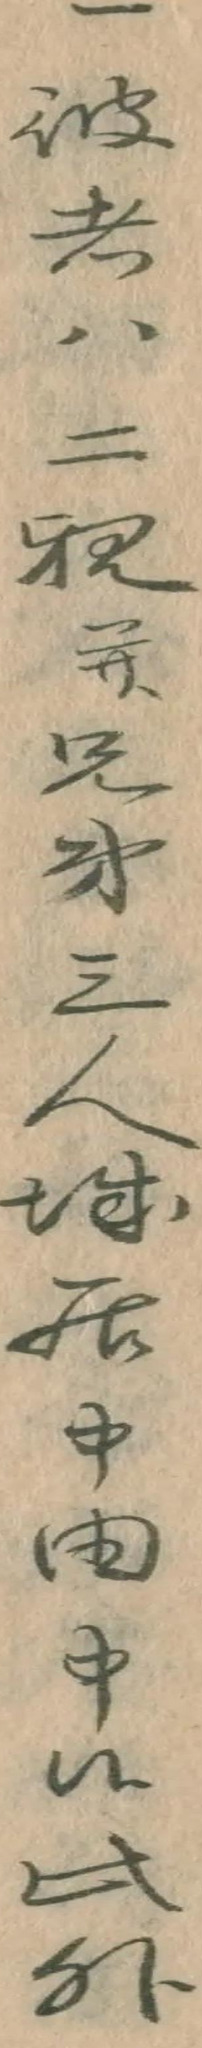一彼者は二親幷兄弟三人城居申由申候此外
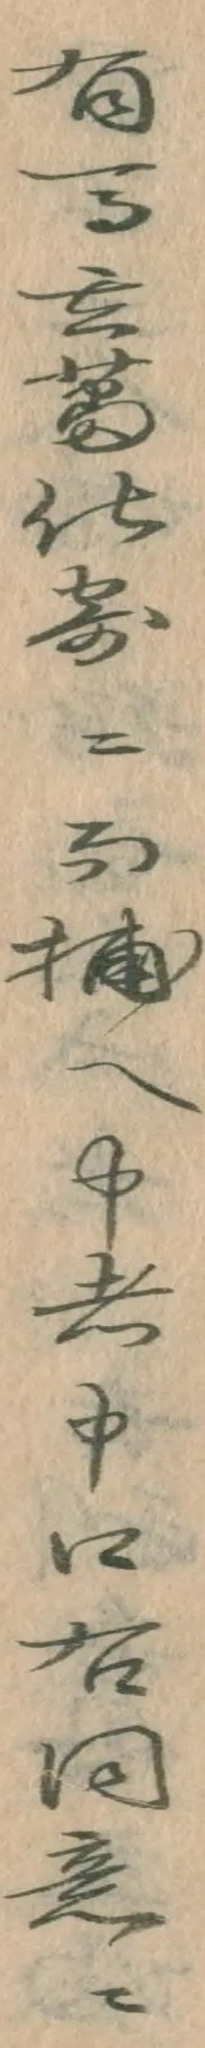有馬玄蕃仕寄に而捕へ申者申口右同意に
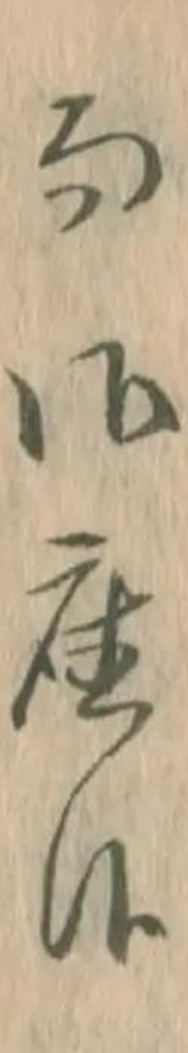而御座候
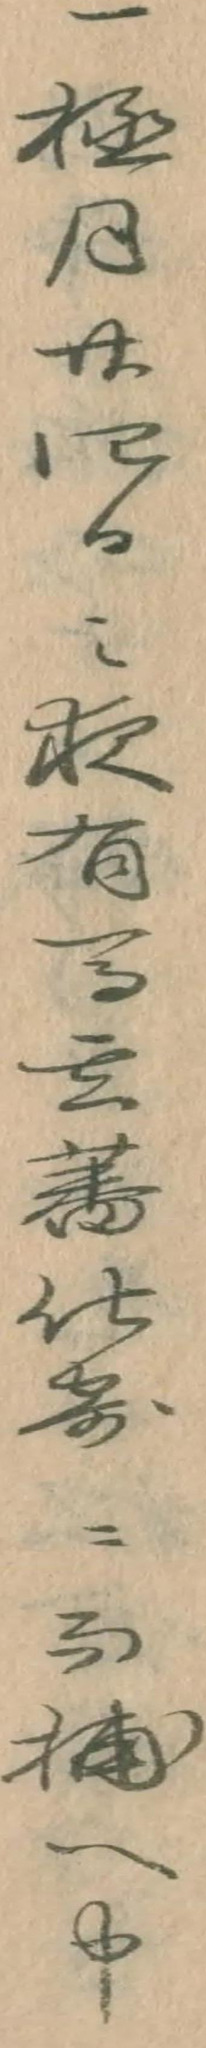一極月廿四日之夜有馬玄蕃仕寄に而捕へ申

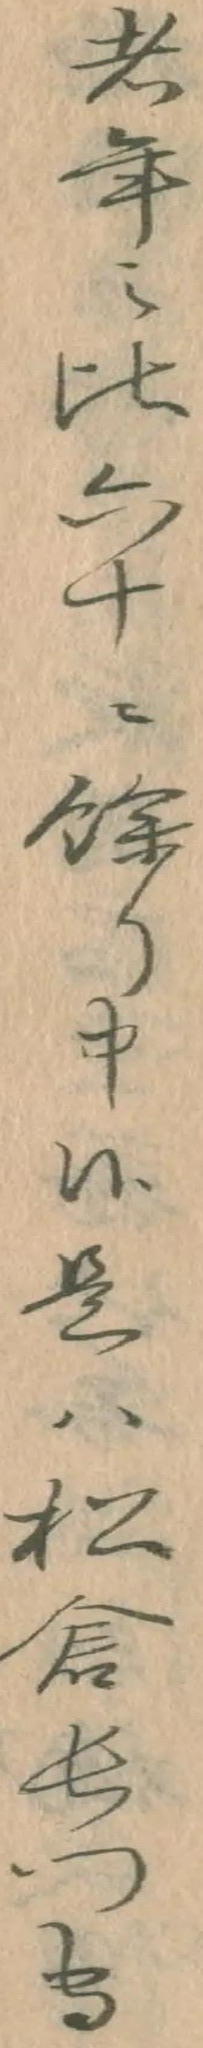者年之比六十に余り申候是は松倉長門守
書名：切支丹御退治記 49巻. [4]
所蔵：国立国会図書館 National Diet Library, JAPAN
